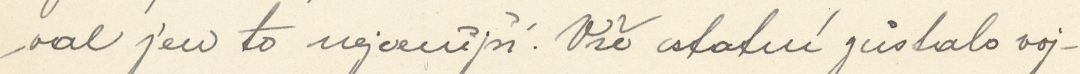val jen to nejcenější. Vše ostatní zůstalo voj-
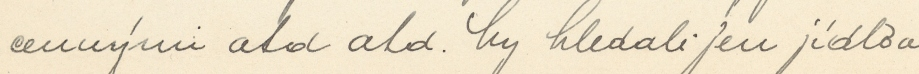cennými atd. atd. My hledali jen jídlo a
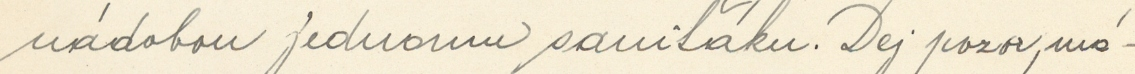nádobou jednomu saniťáku. Dej pozor, má-
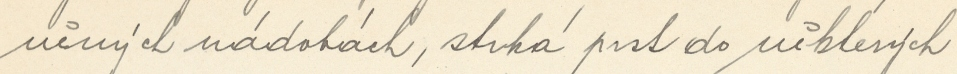něných nádobách, strká prst do některých
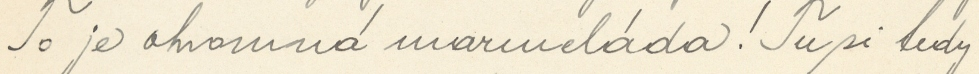To je ohromná marmeláda! Tu si tedy
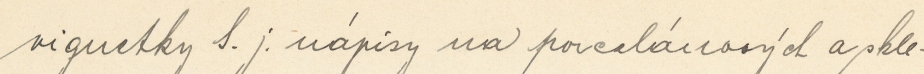vignetky t. j. nápisy na porcelánových a skle-
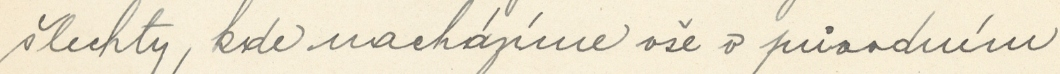šlechty, kde nacházíme vše v původním
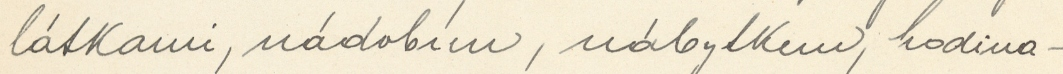látkami, nádobím, nábytkem, hodina-
